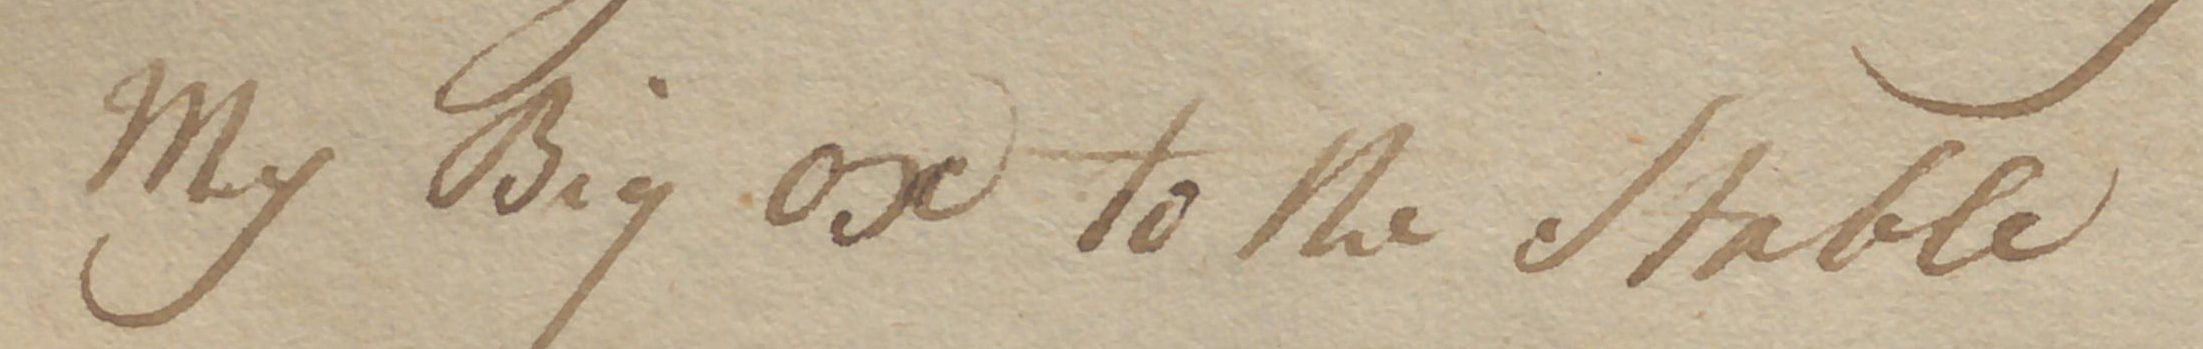My Beg ox to the Stable
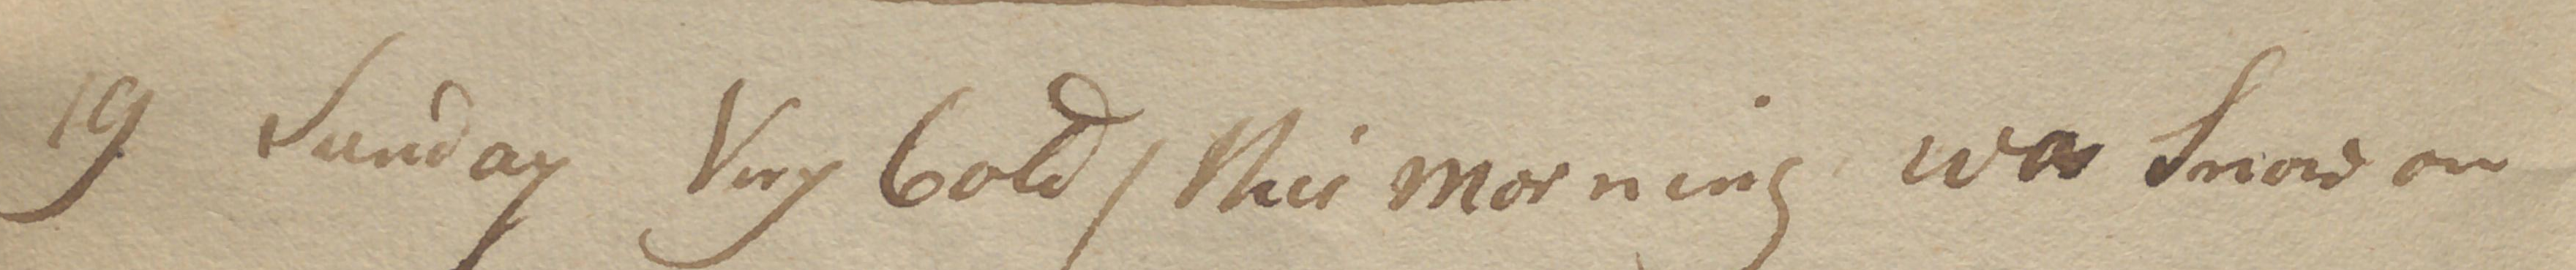19 Sunday Very Cold / this morning was snow on
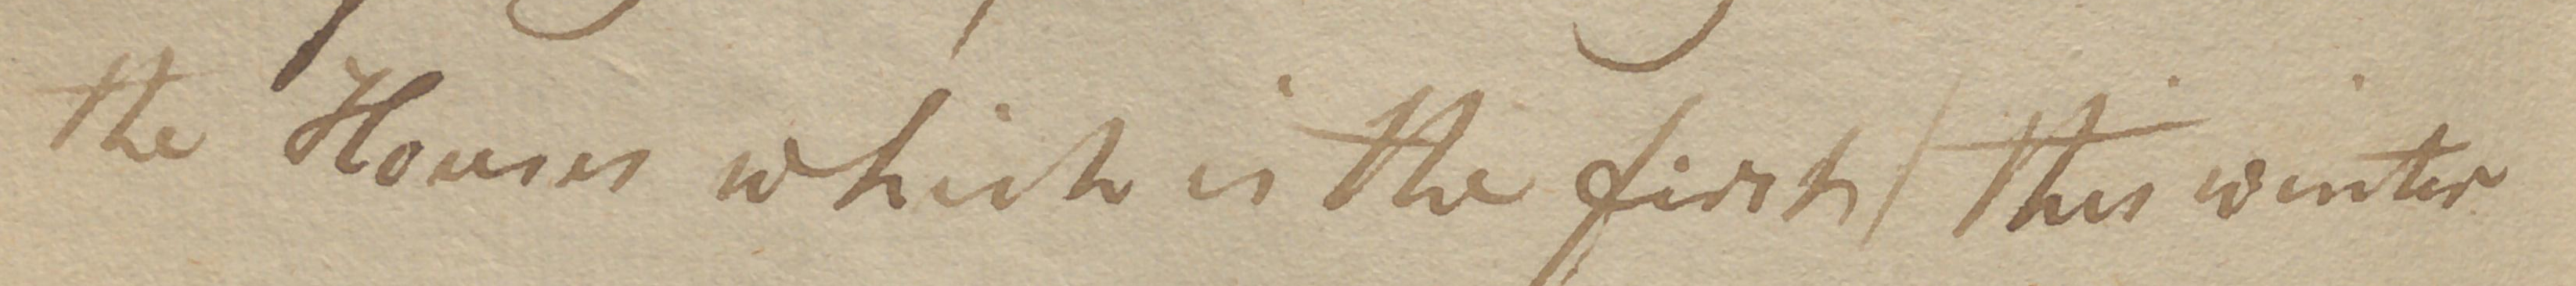the Houses which is the first / this winter
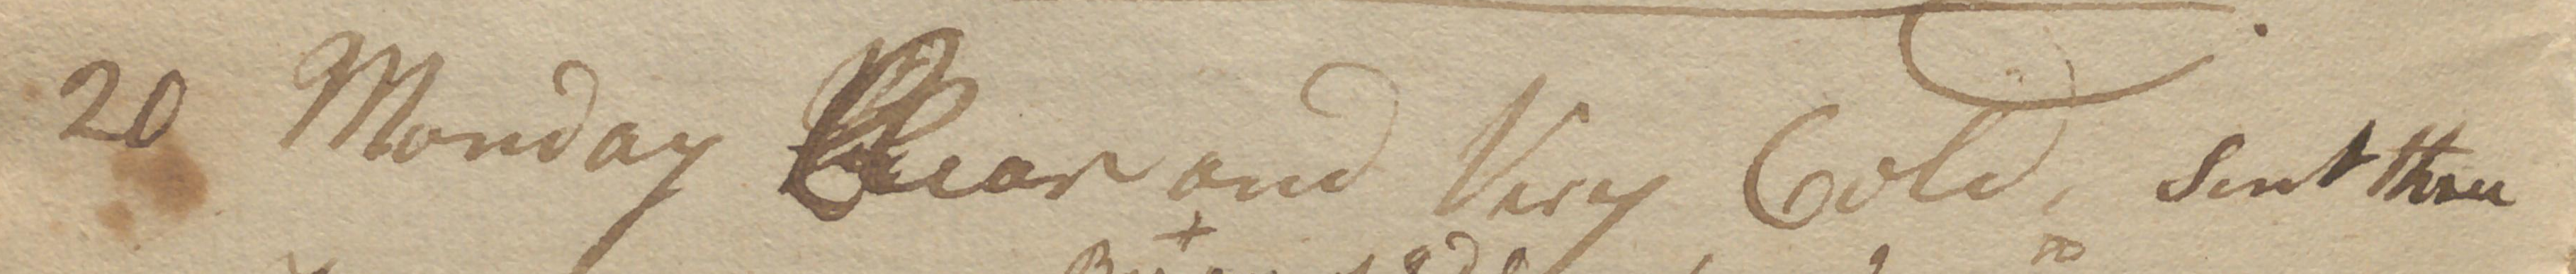20 Monday Clear and Very Cold, sent three
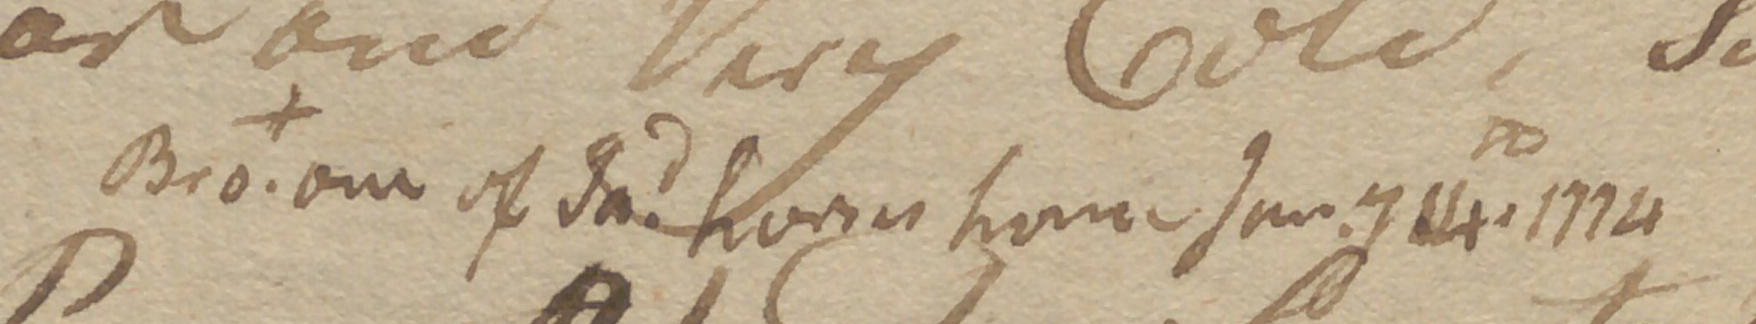Bro^t. one of sa^d. Horses home Jan^y. 14^th. 1774
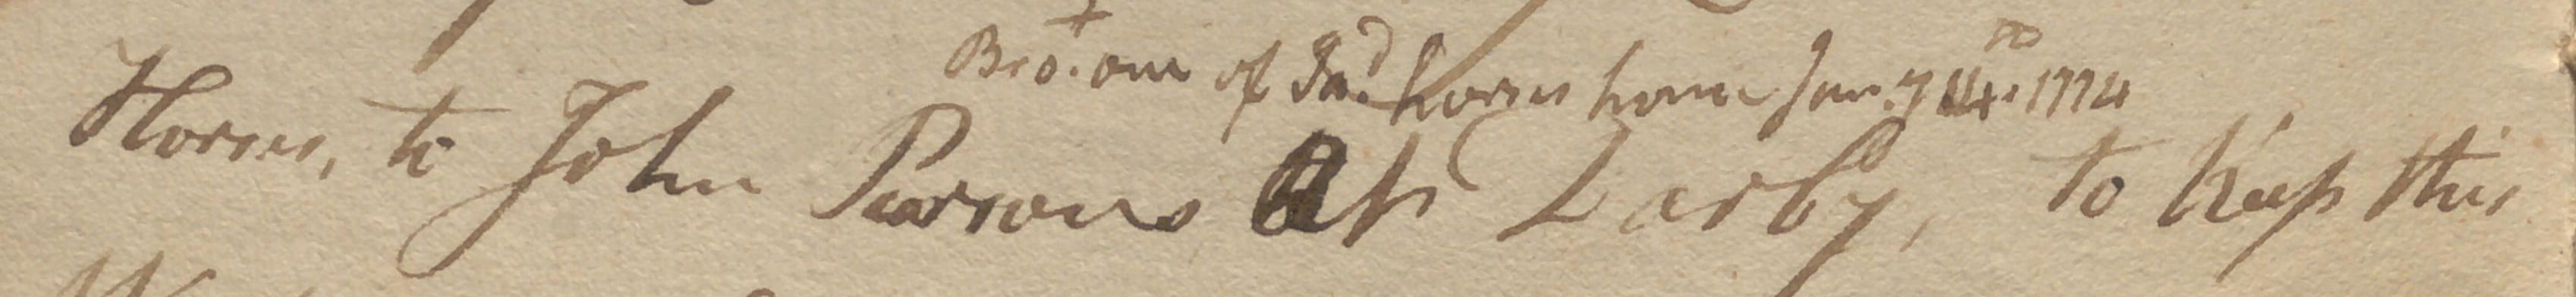Horses to John Parsons At Darby, to Keep this
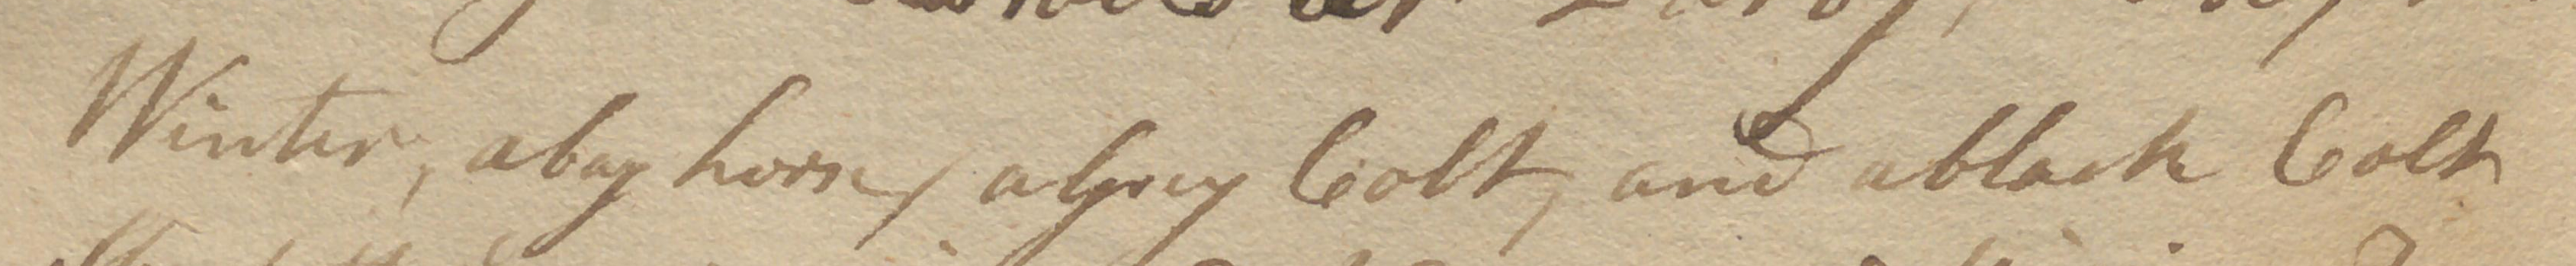Winter, a bay horse, a Grey Colt, and a black Colt
